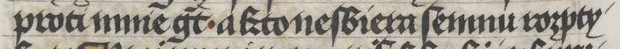proti mnie ḡt.a kto neſbiera ſemnu rozpty¬
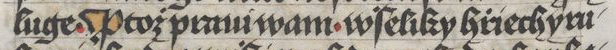luge.Ꝓtoż praui wam.wẛeliky hṙiechy ru¬
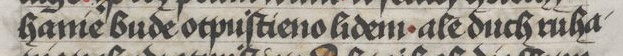hanie bude otpuẛtieno lidem.ale duch ruha¬
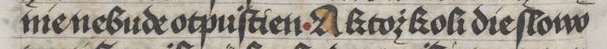nie nebude otpuẛtien.A ktoż koli díe ſlowo
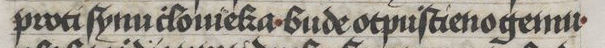proti ſynu ċlouieka.bude otpuẛtieno gemu.
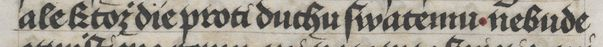ale ktoż díe proti duchu ſwatemu.nebude
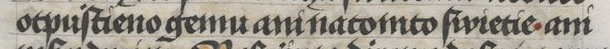otpuẛtieno gemu ani natomto ſwietie.ani
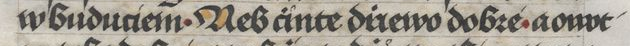w buducíem.Neb ċinte dṙiewo dobré.a owot¬
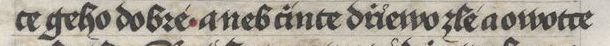ce geho dobré.a neb ċinte dṙiewo zlé a owotce
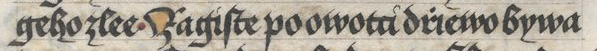geho zlee.Zagiſte po owotci dṙiewo bywa
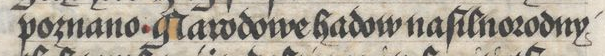poznano.Narodowe hadow naſilnorodny¬
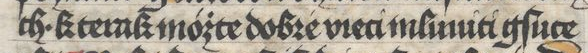ch.kterak możte dobre vieci mluuiti gſuce
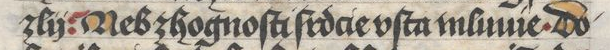zlij?Neb zhognoſti ſrdcie vſta mluuíe.Do¬
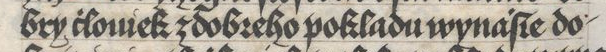bry ċlouiek z dobreho pokladu wynaẛie do¬
